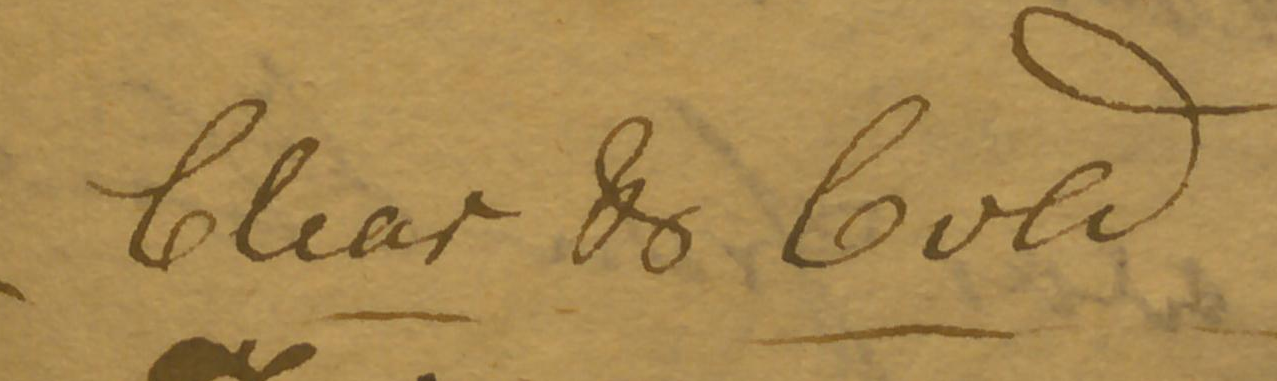Clear & Cold
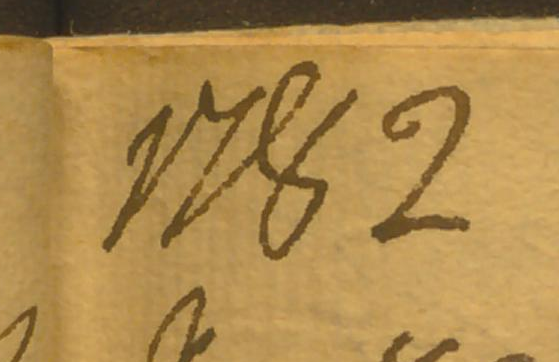1782
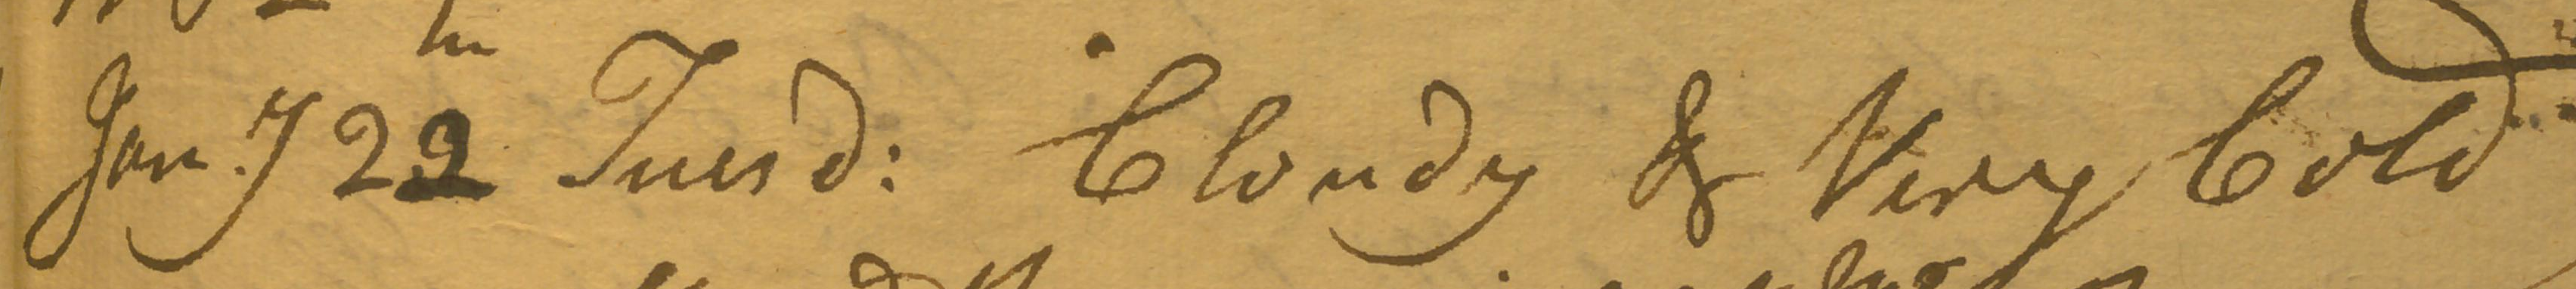Jan^y. 22^h Tuesd: Cloudy & Very Cold
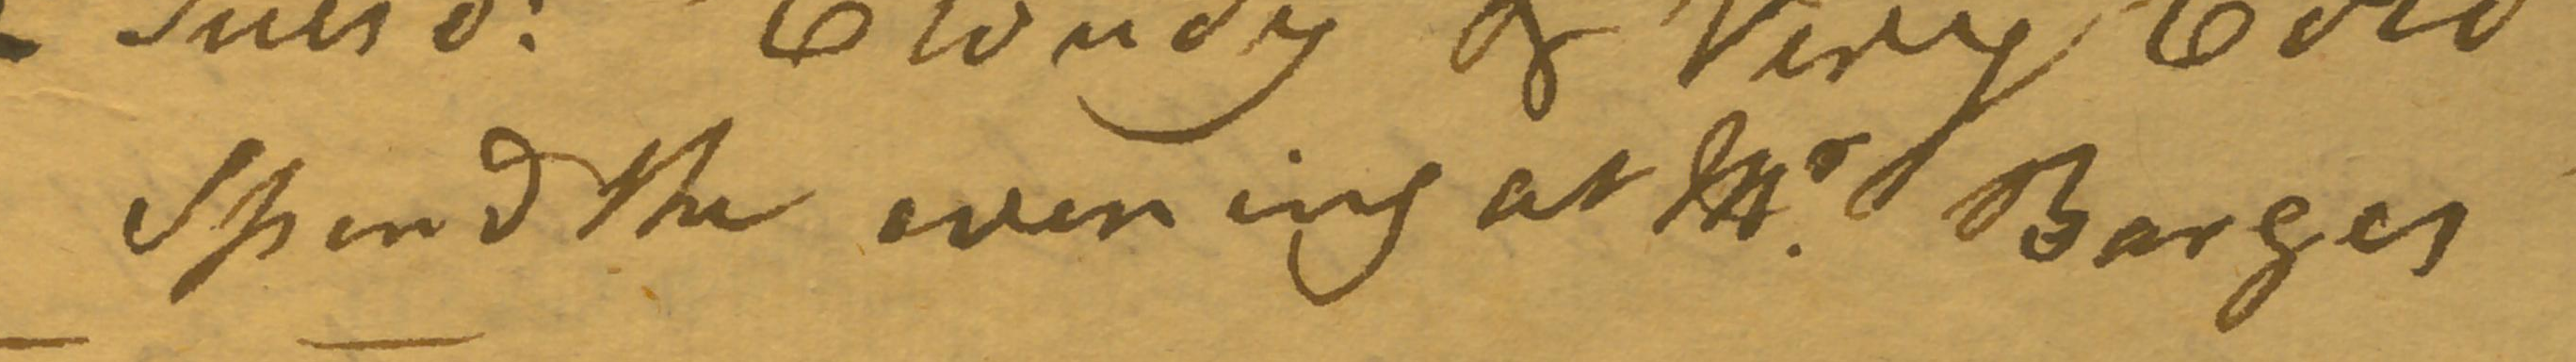spend the evening at M^r. Barges
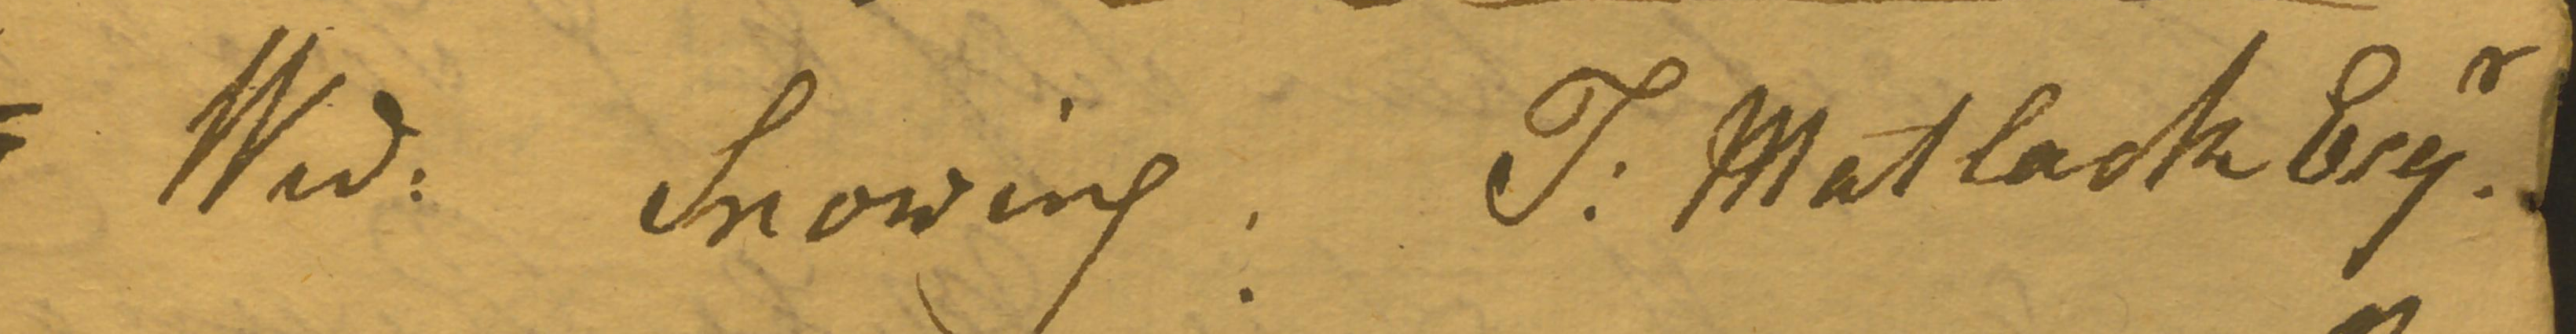Wed. Snowing. T: Matlack Esq^r.
